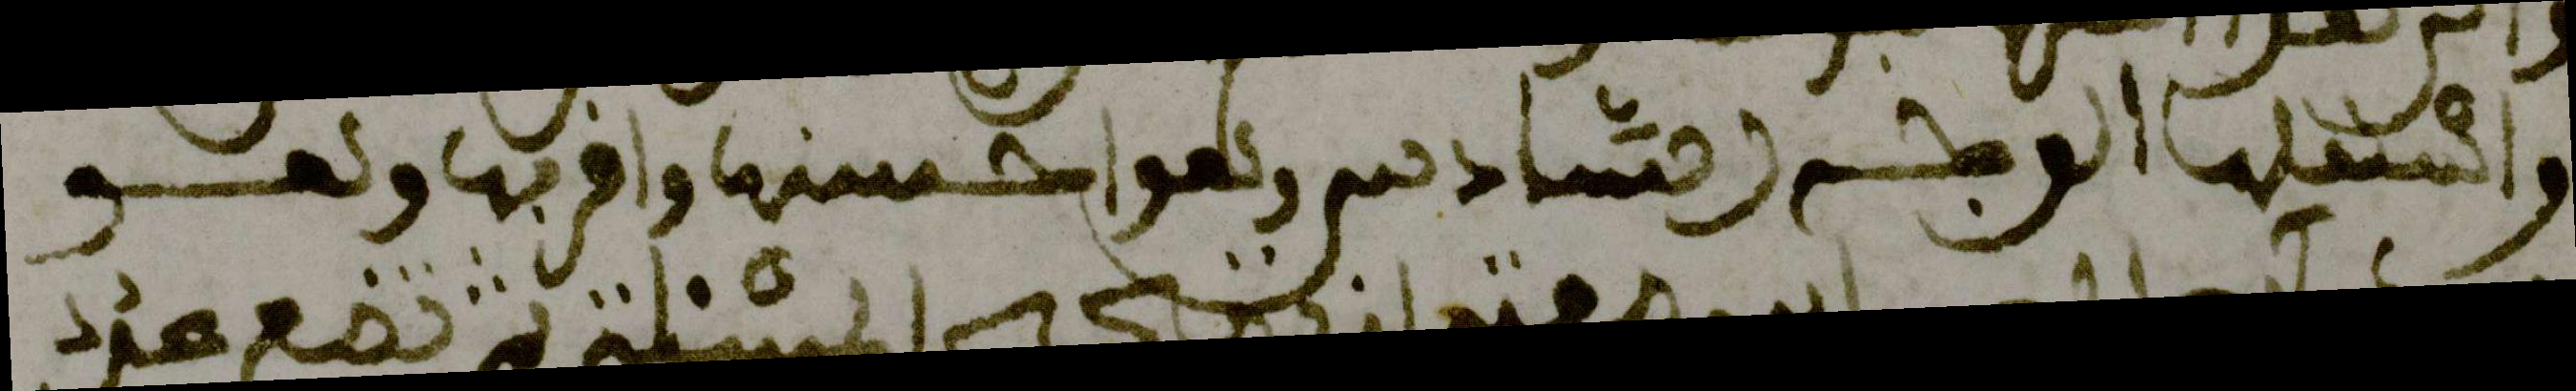واسْهلِها الوجه السَّادس وهو احسنها واقربها وهو
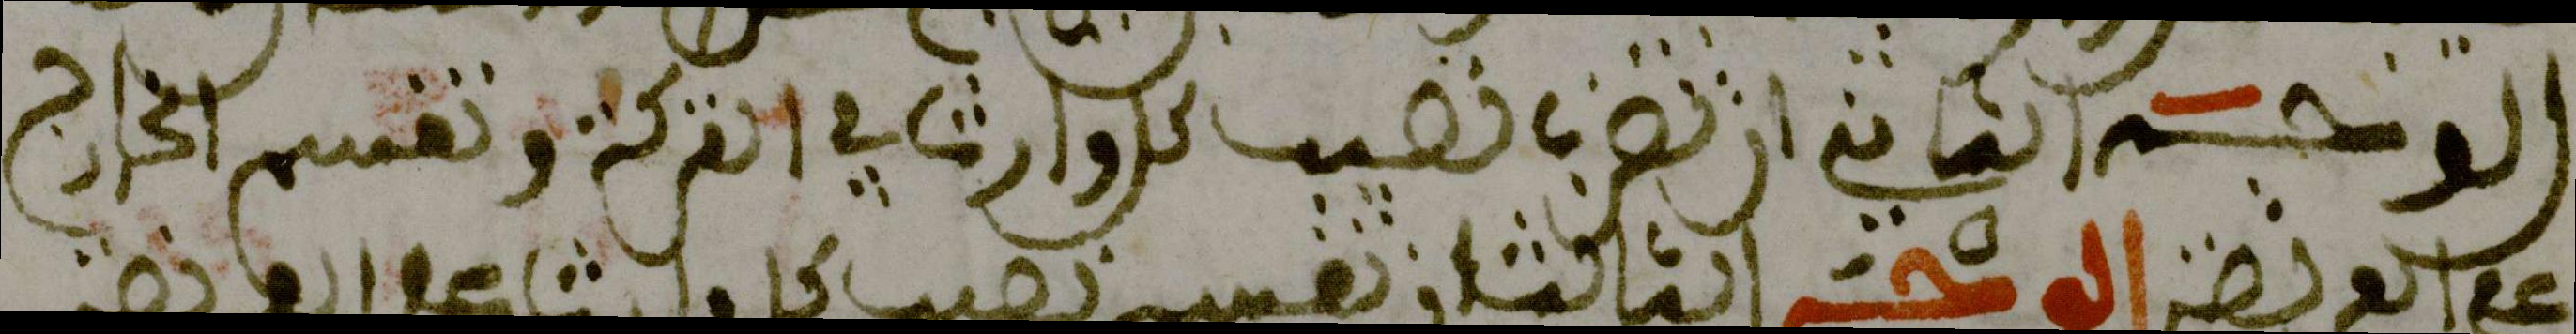الوجهَ الثاني ان تضرب نصيب كل وارث في التركة وتقسم الخارج
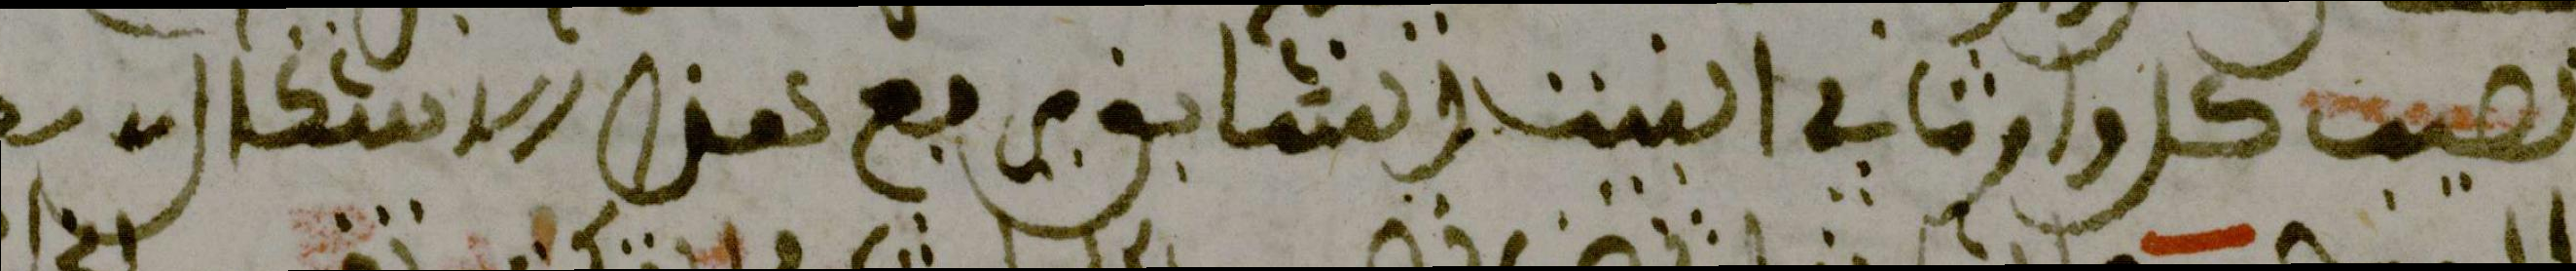نصيب كل وارث في البيت السَّابق يدفع هذا الاشكال
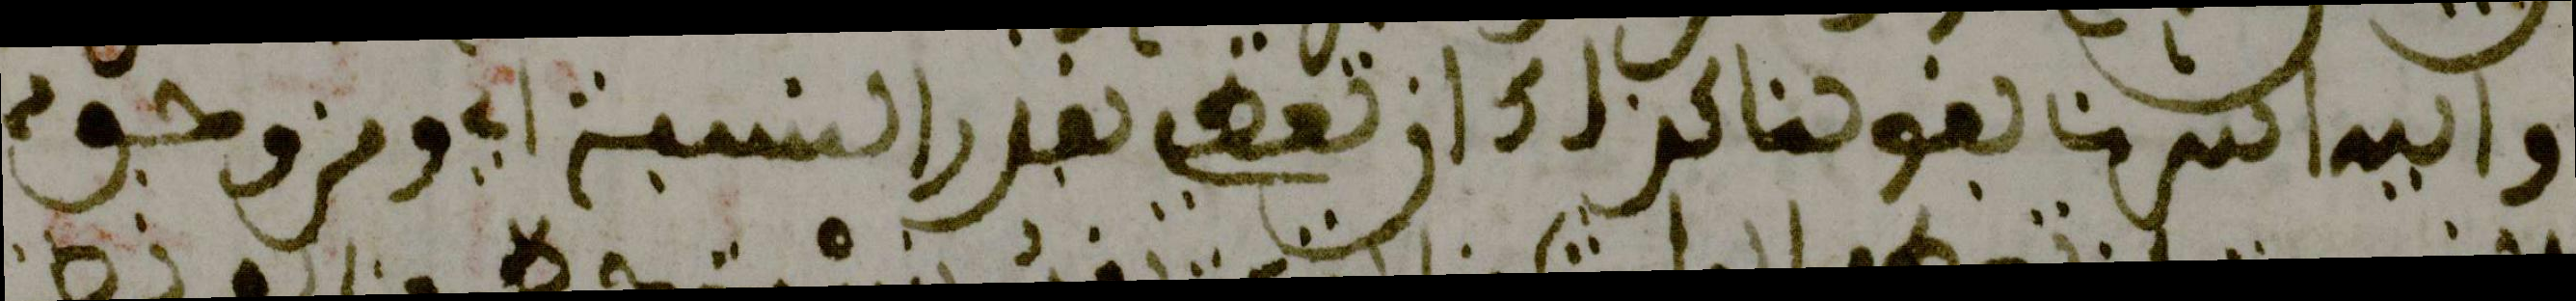واليه اشرن بقولنا كذاك ان تعطي بقدر النسبة اي ومن وجوه
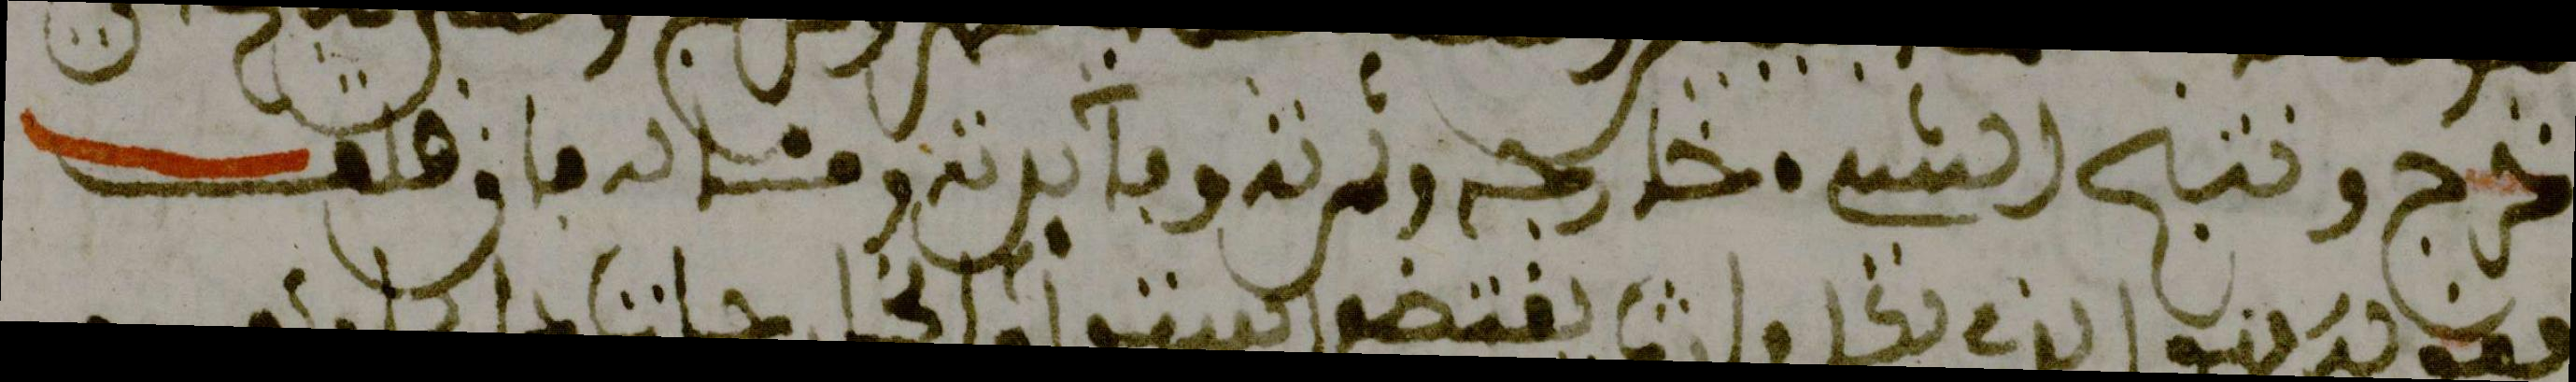خرج ونتج الشيء خارجه وثمرته وفائدته ومئاله فان قلتَ
